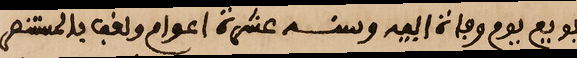بويع يوم وفاة ابيه وسنه عشرة اعوام ولقب بالمستنصر
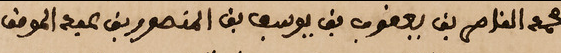محمد الناصر بن يعقوب بن يوسف بن المنصور بن عبد المومن
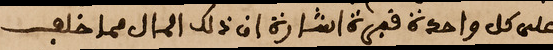على كل واحدة قبرة اشارة ان ذلك المال مما خلف
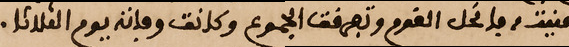منيت فانحل القوم وتفرقت الجموع وكانت وفاته يوم الثلاثاء
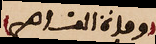وفاة الناصر
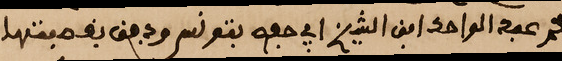محمد عبد الواحد ابن الشيخ ابي حفص بتونس ودفن بقصبتها
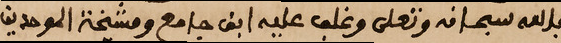بالله سبحانه وتعلى وغلب عليه ابن جامع ومشيخة الموحدين
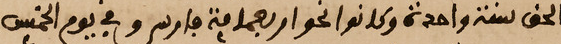الحق سنة واحدة وكانوا نحو اربعماية فارس وفي يوم الخميس
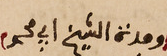وفاة الشيخ ابي محمد
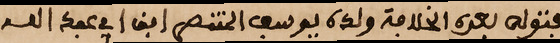فتولى بعده الخلافة ولده يوسف المنتصر ابن ابي عبد الله
